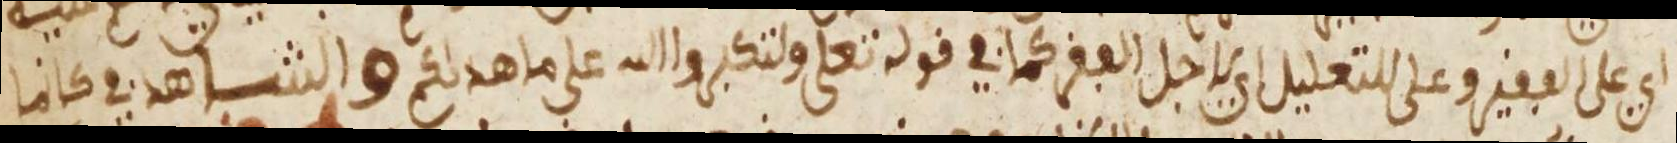اي على الفقير و على للتعليل اي لاجل الفقر كما في قوله تعالى ولتكبروا الله على ما هداكم و الشاهد في كانما
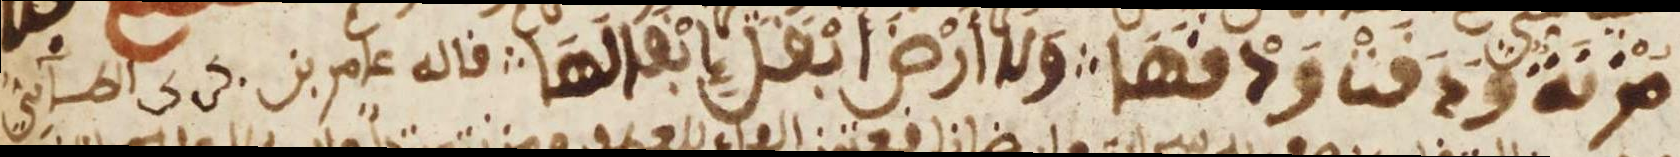مزنة ودقت ودقها و لا أرض أبقل إبقالها قاله عامر بن #؟؟؟ الطائي
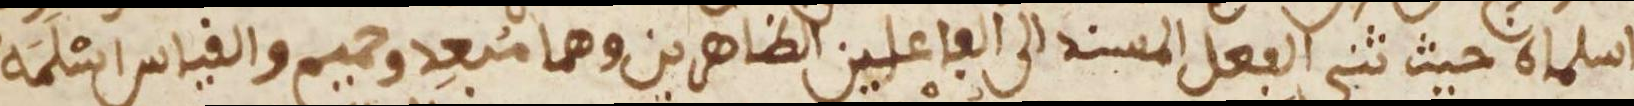اسلماه حيث ثنى الفعل المسند الى الفاعلين الظاهرين و هما مبعد و حميم و القياس اسلمه
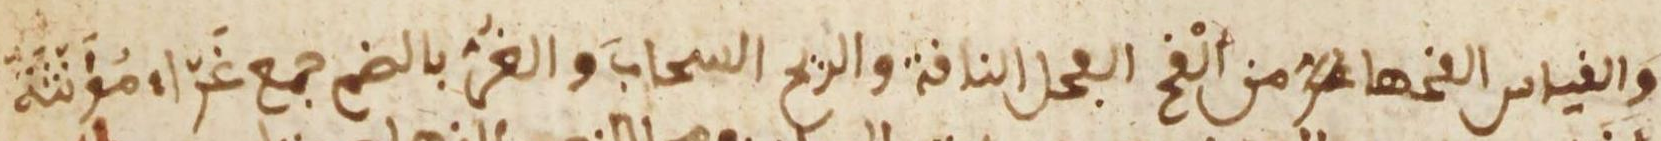و القياس القحها من ألقح الفحل الناقة و الريح السحاب و الغر بالضم جمع غراء مؤنثة
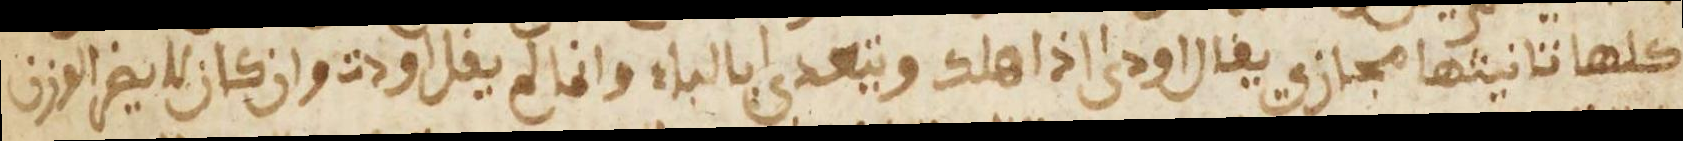كلها تانيثها مجازي يقال اودىٰ اذا هلك و يتعدىٰ بالباء و انما لم يقل اودت و ان كان لا يضر الوزن
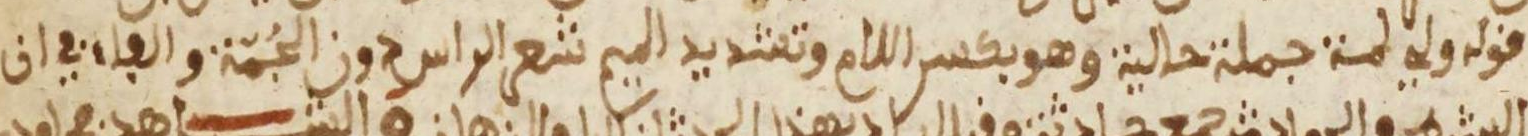قوله و لي لمة جملة حالية و هو بكسر اللام و تشديد الميم شعر الراس دون الجمة والفاء في ان
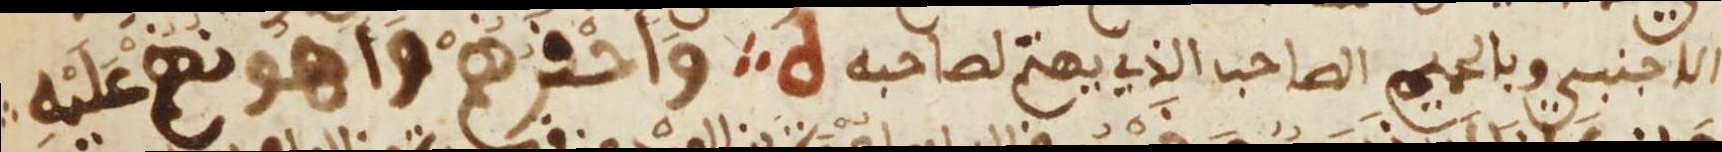الاجنبي و بالحميم الصاحب الذي يهتم لصاحبه ه و أحقرهم و أهونهم عليه
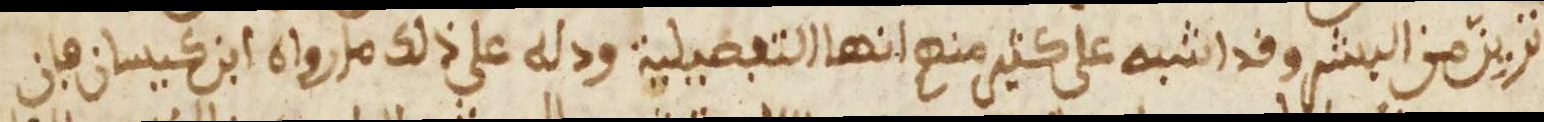ترين من البشر و قد اشبه على كثير منهم انها التفصيلية و دله على ذلك ما رواه ابن كيسان فان
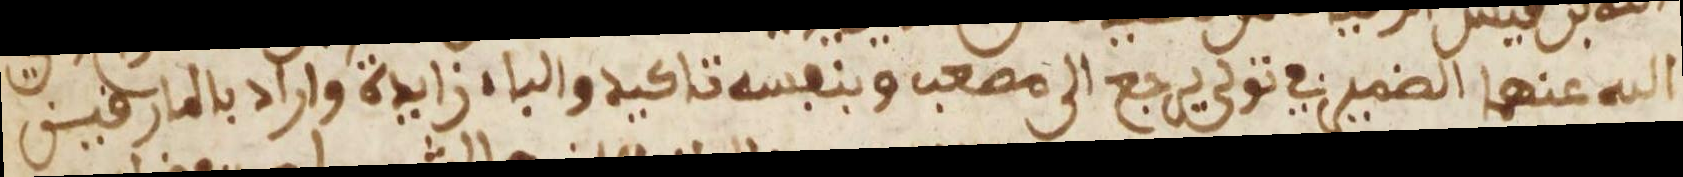الله عنهما الضمير في تولى يرجع الى مصعب و بنفسه تاكيد و الباء زايدة و اراد بالمارقين
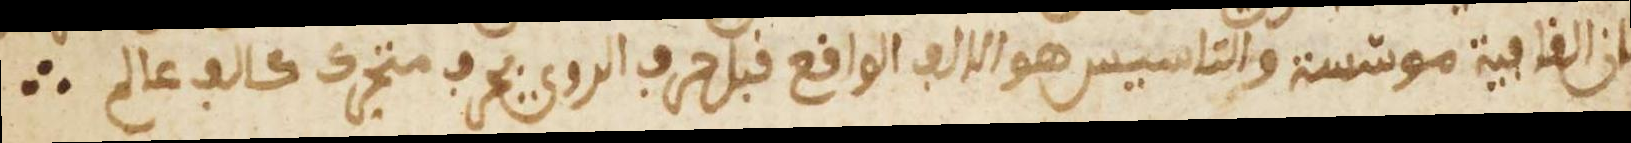لان القافية مؤسسة و التاسيس هو الالف الواقع قبل حرف الروي بحرف متحرك كالف عالم
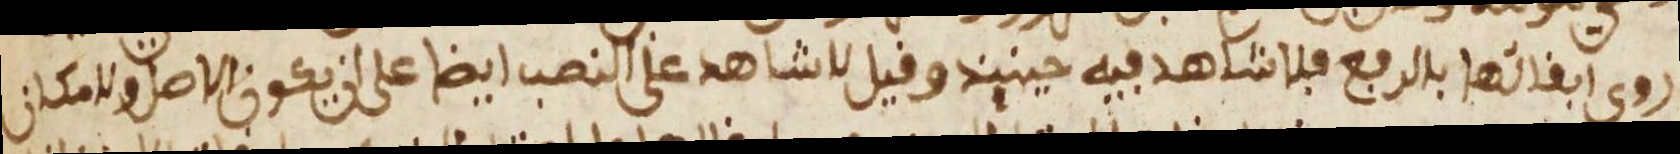روى ابقائها بالرفع فلا شاهد فيه حينئذ و قيل لا شاهد على النصب ايضا على ان يكون الاصل و لا مكان
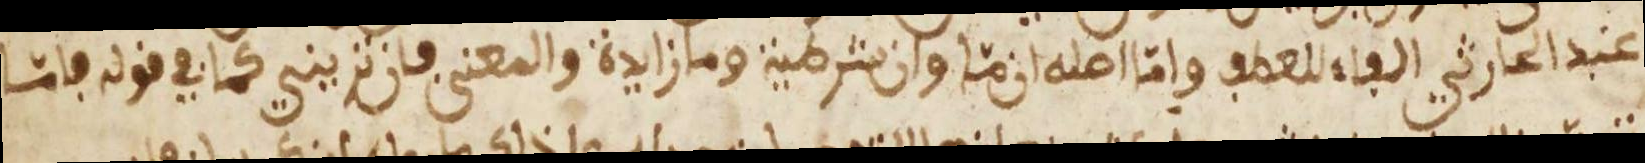عبد الحارثي الفاء للعطف و إما اصله ان ما و ان شرطية و ما زايدة و المعنى فان تريني كما في قوله فاما
